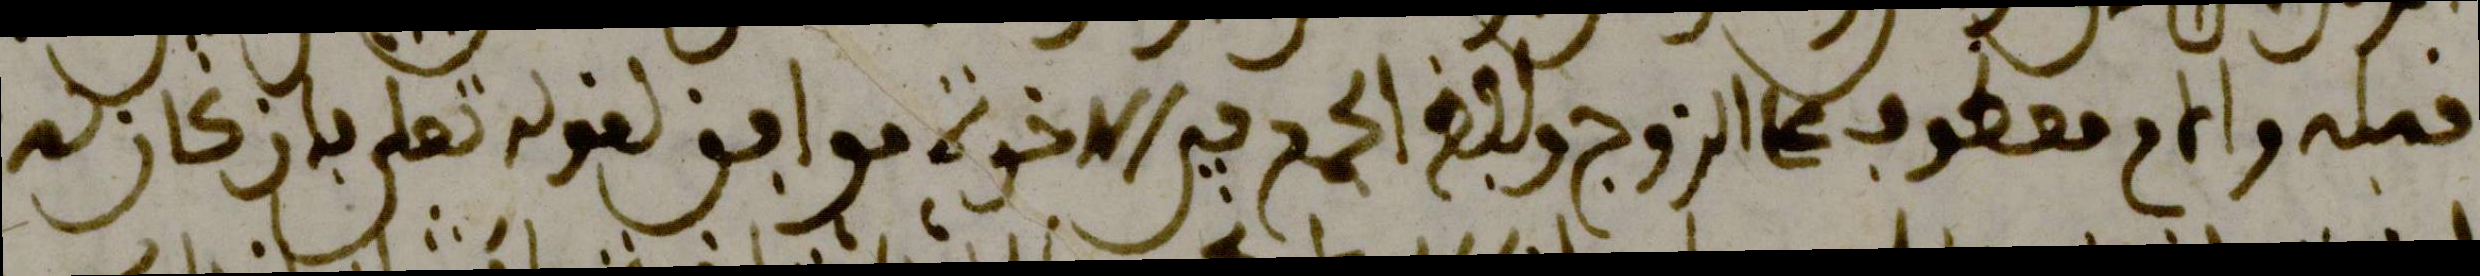قبله والام معطوف على الزوج ولفض الجمع في الاخوة موافق لقوله تعلى فان كان له
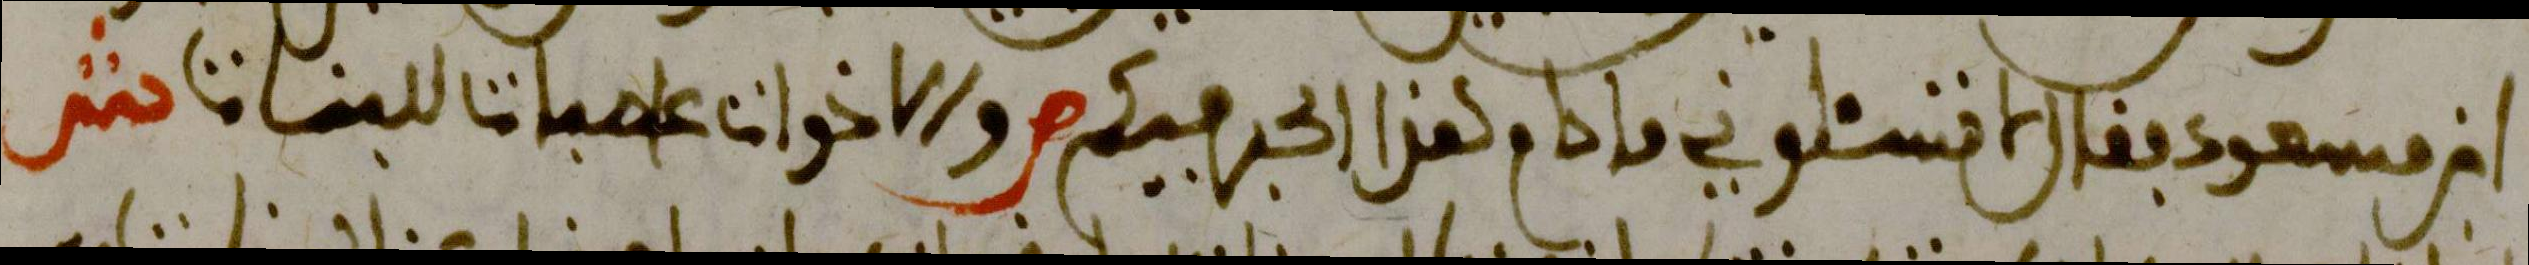ابن مسعود فقال لا تسئلوني مادام هذا الحبر فيكم ص ولاخوات عاصبات للبنات ش
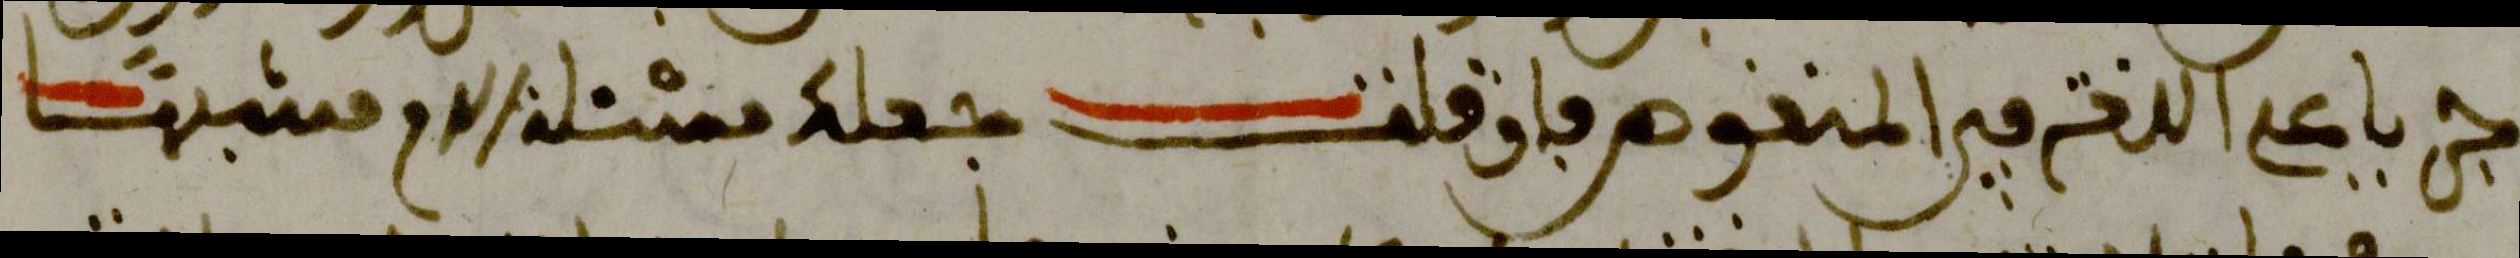جر يا على اللغة في المنقوص فان قلت جعلك مسْئلة الام مشبها
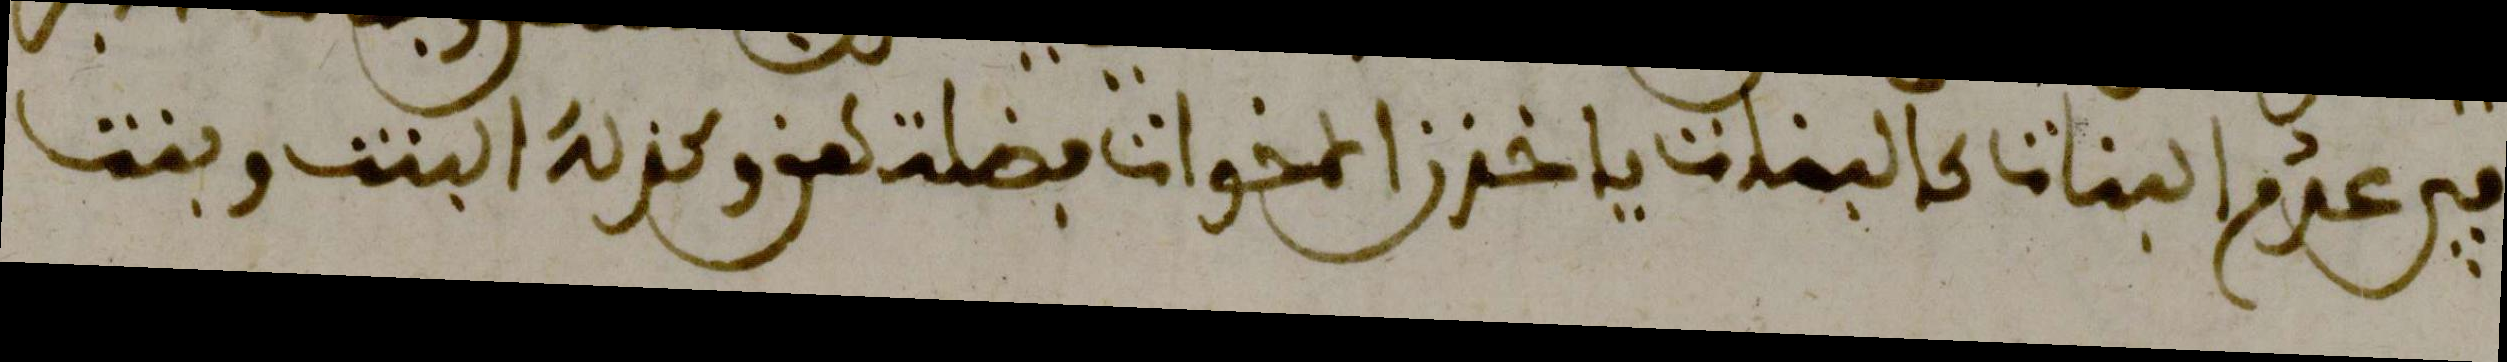في عدم البنات كالبنات ياخذن الاخوات فضلتهن وكذلك البنت وبنت
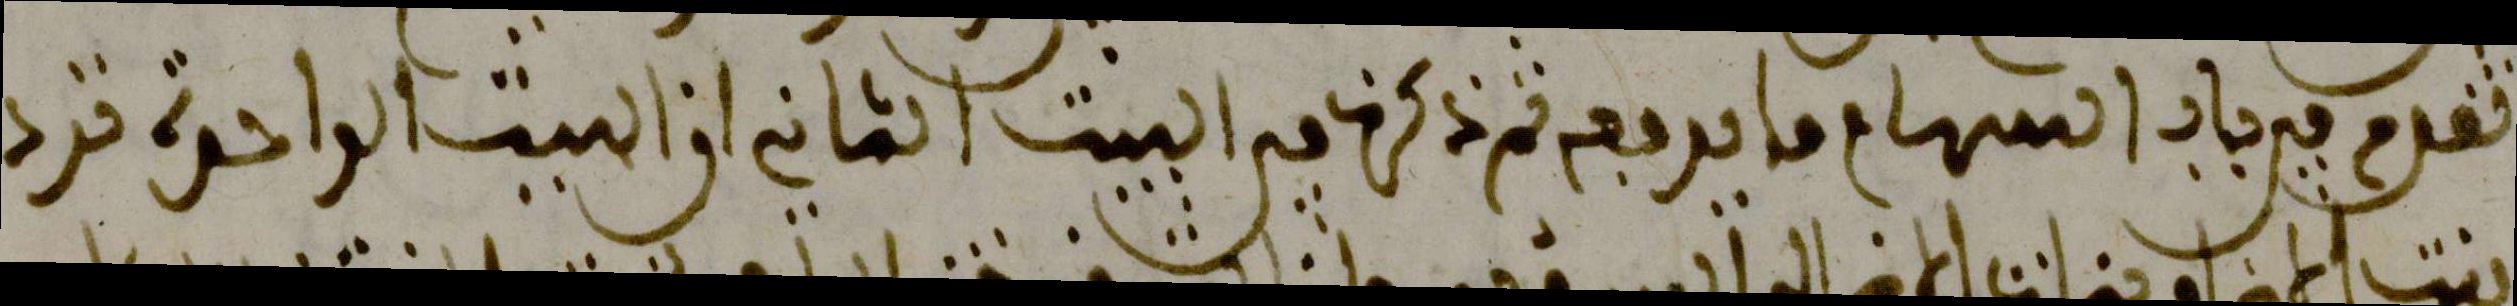تقدم في باب السهام ما يدفعه ثم ذكرن في البيت الثاني ان البيت الواحدة ترد
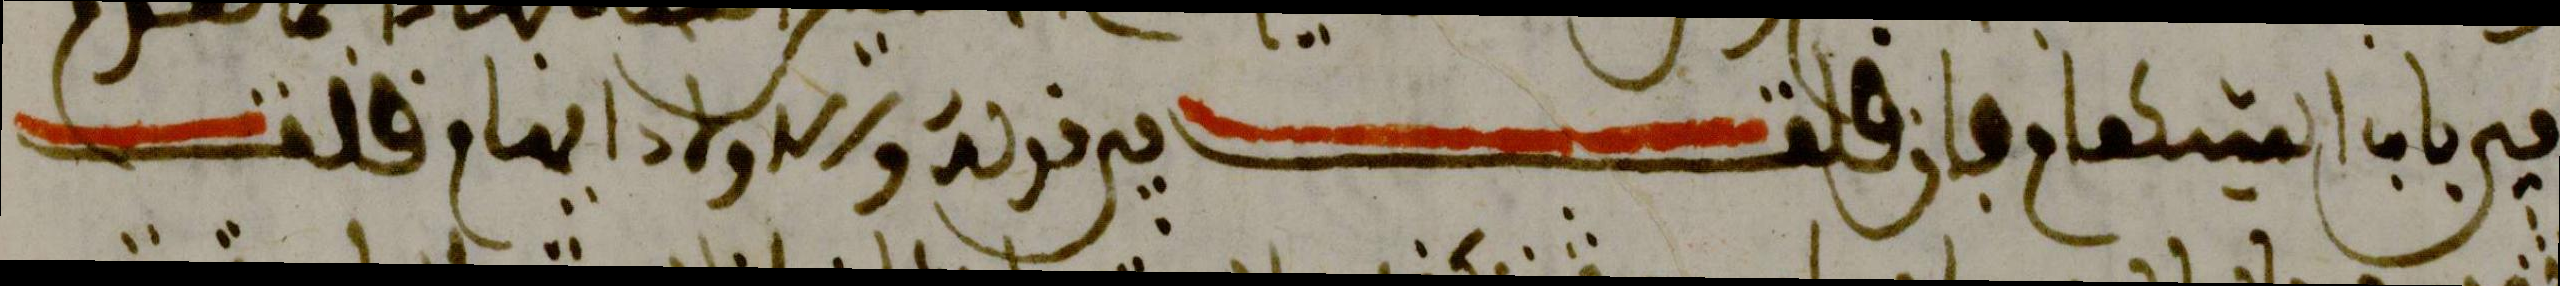في باب السّهام فان قلت في قولك والاولاد ايهام قلت
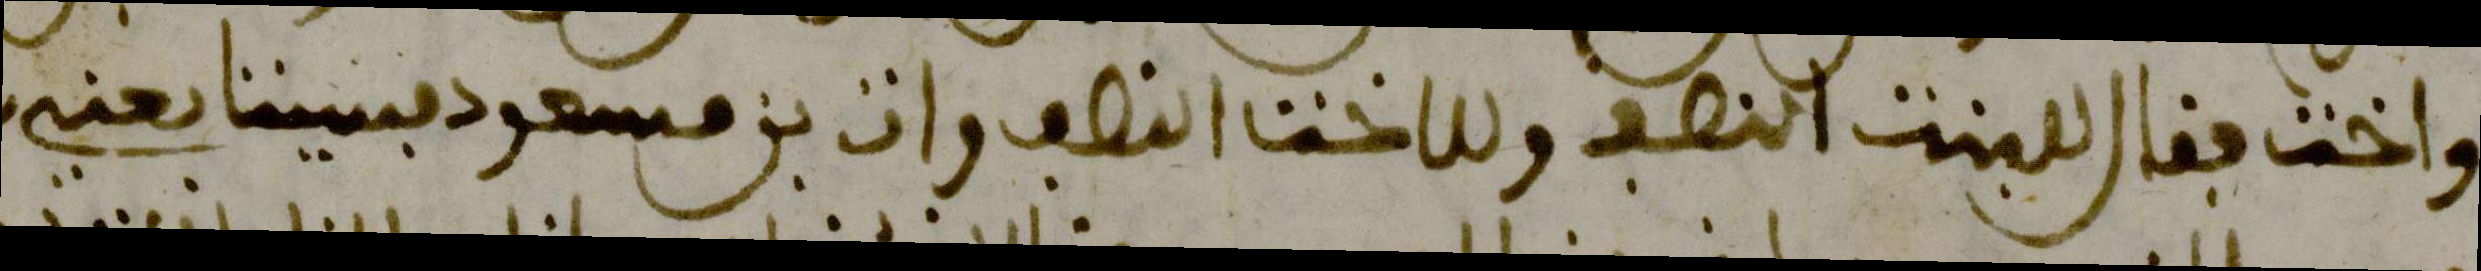واخت فقال للبنت النصف وللاخت النصف وات بن مسعود فسيتا بعني
